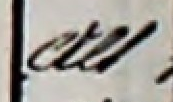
Alt
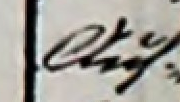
Aus„
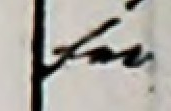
see
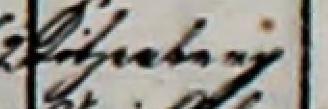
Kitzenberg
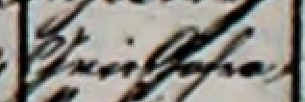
Christofer„
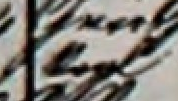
kogl
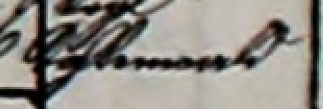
???wald
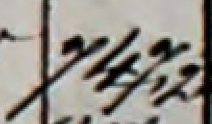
747,2
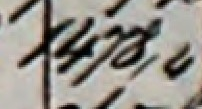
1478,4
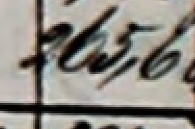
265,6
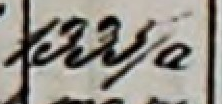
1335/a
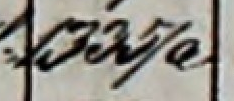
1335/a
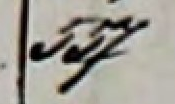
557
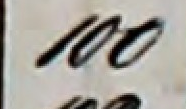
100
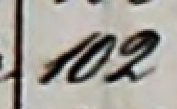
102
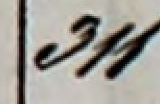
311
